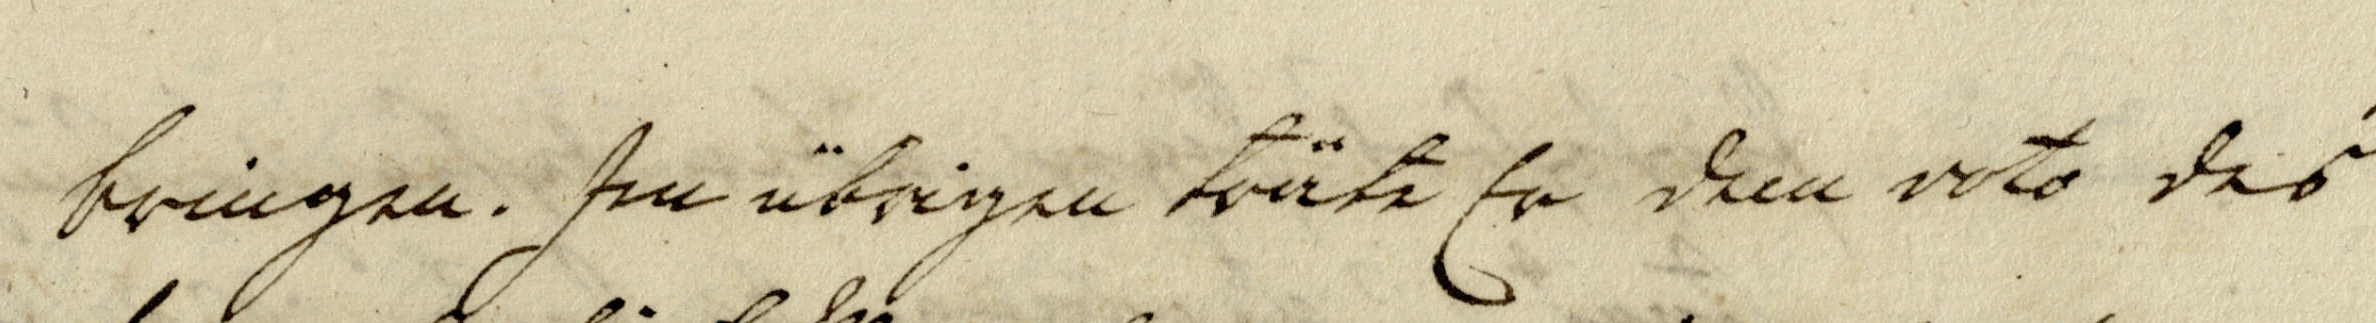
bringen. Im übrigen träte Er dem voto des
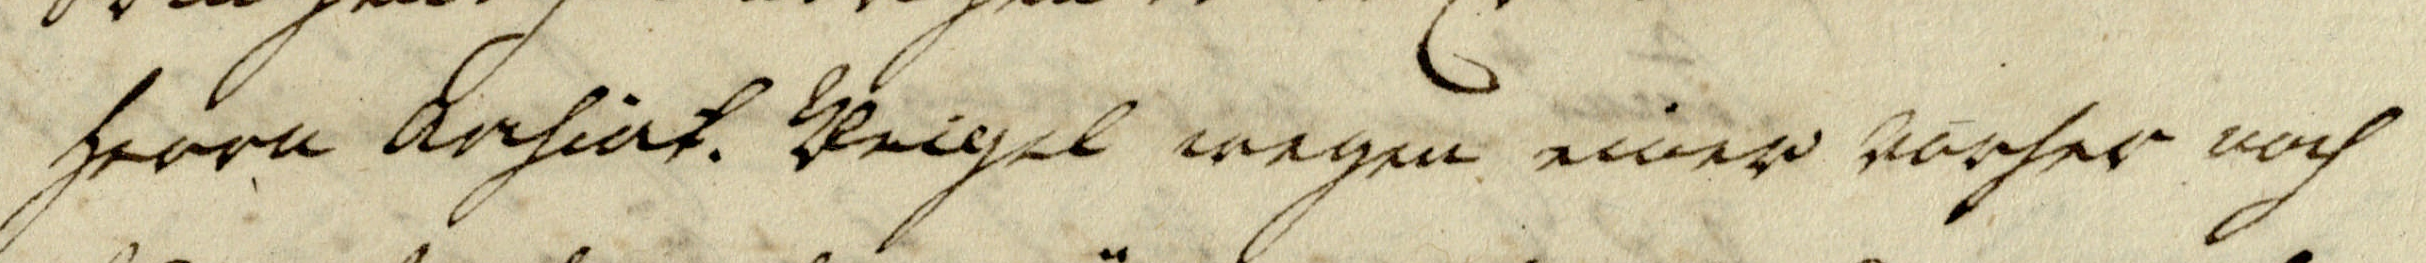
Herrn Archiat. Weigel wegen einer vorher noch
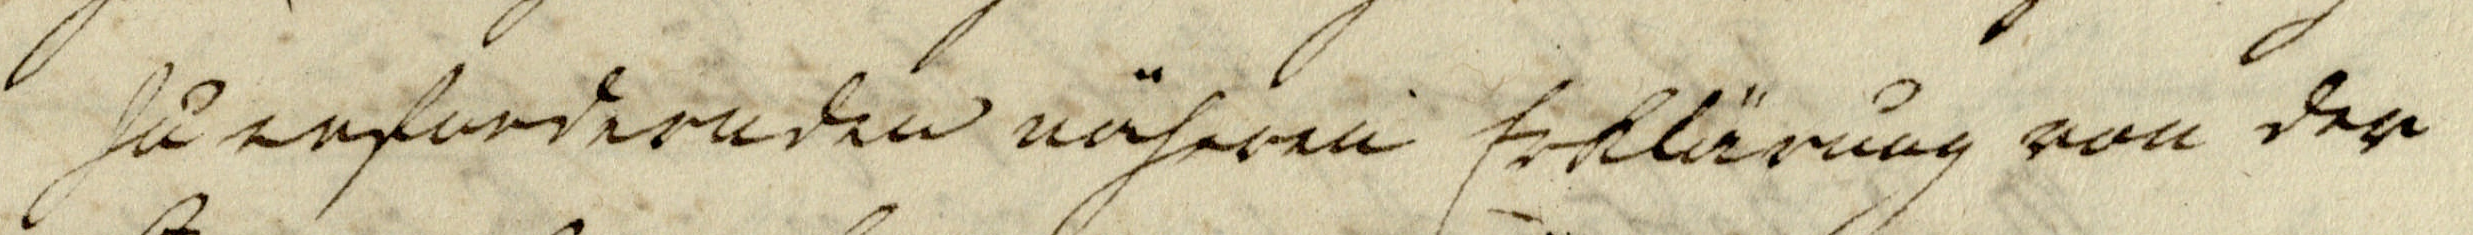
zu erfordernden näheren Erklärung von der
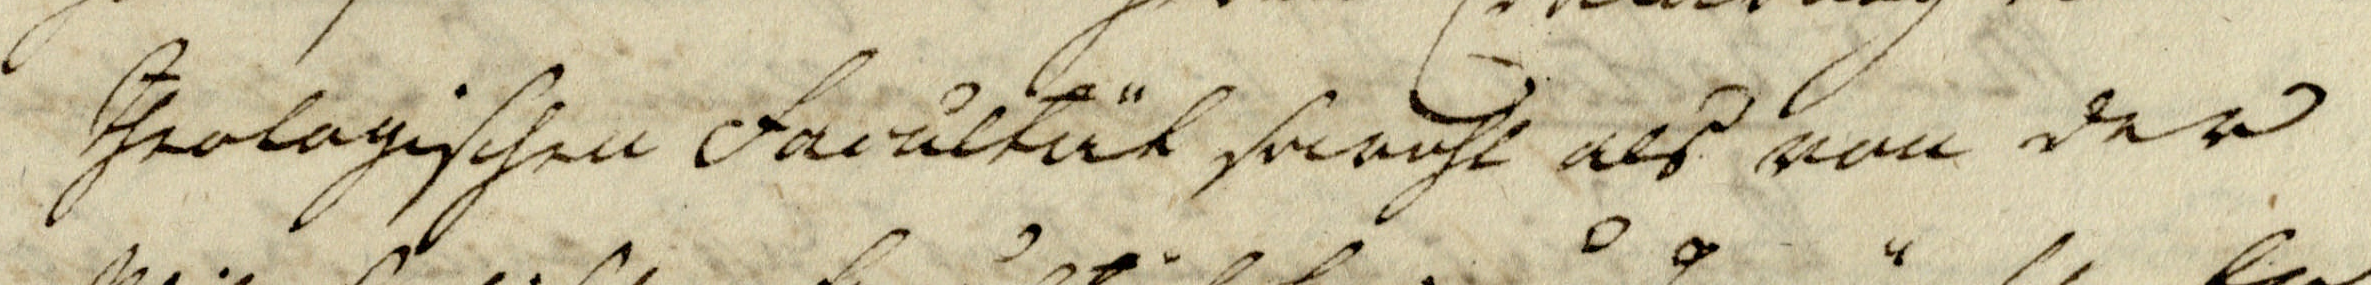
Theologischen Facultät sowohl als von der
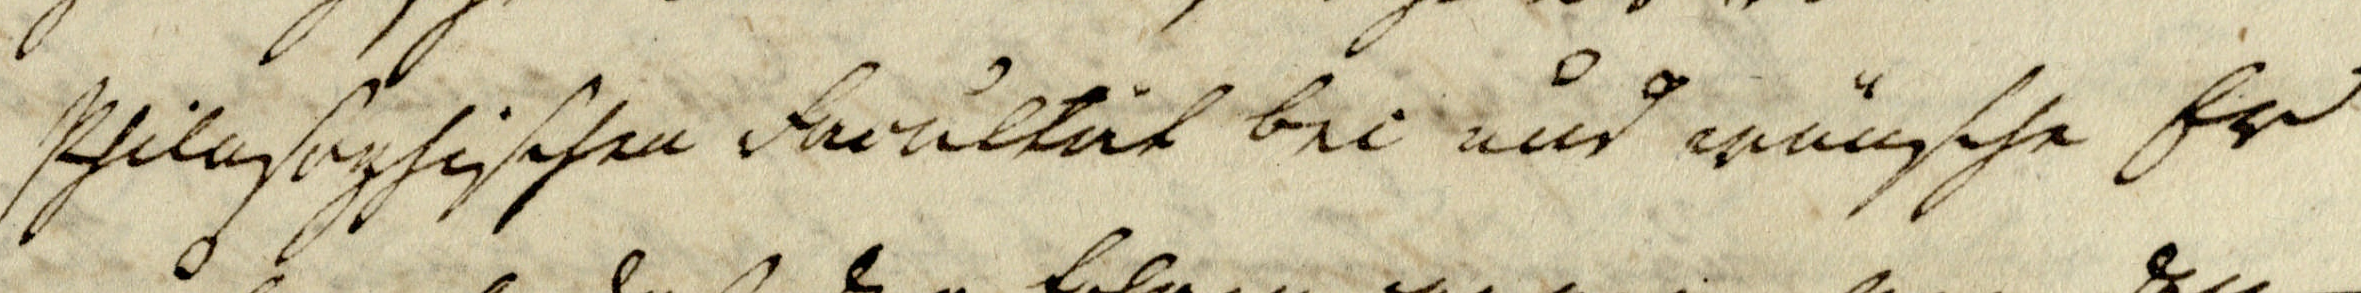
Philosophischen Facultät bei und wünsche Er
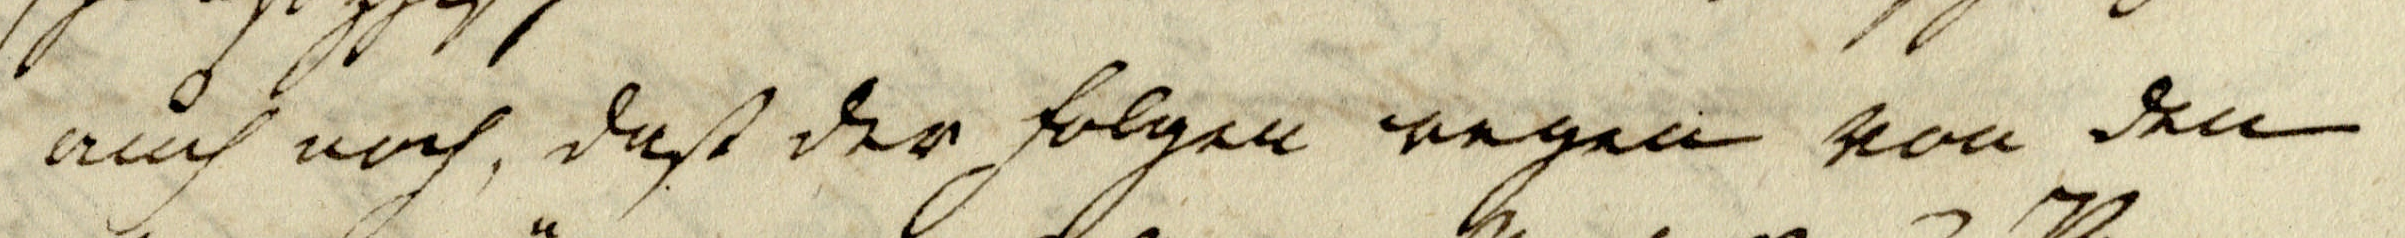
auch noch, daß der Folgen wegen von den
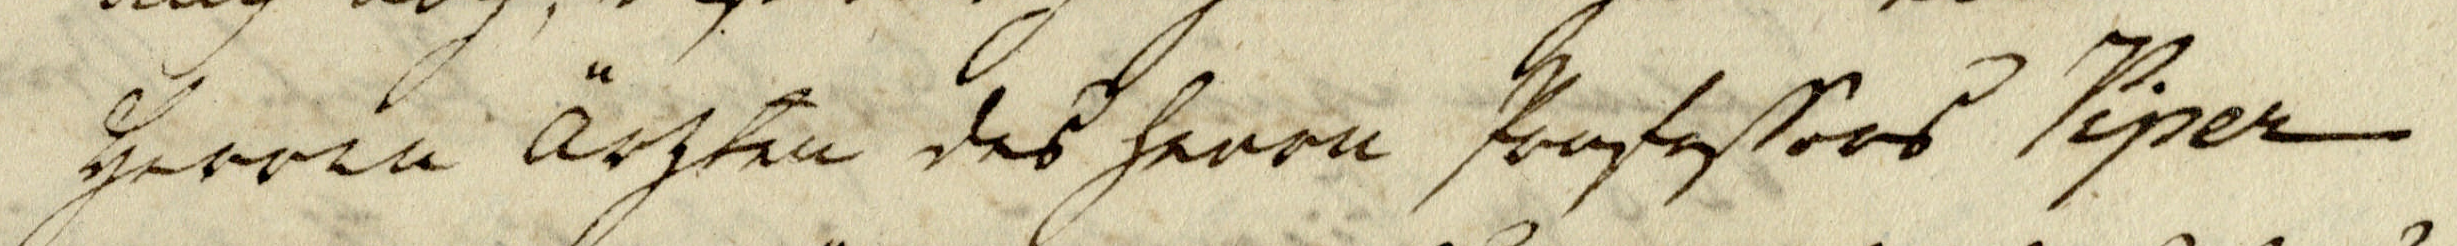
Herren Ärzten des Herrn Professors Piper
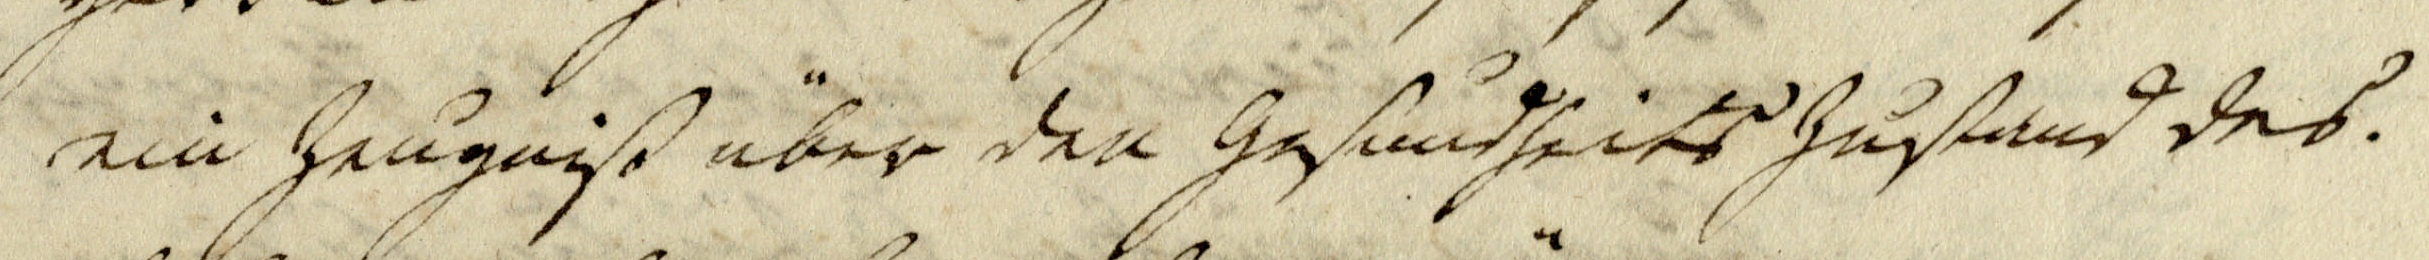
ein Zeugniß über den Gesundheits zustand des¬
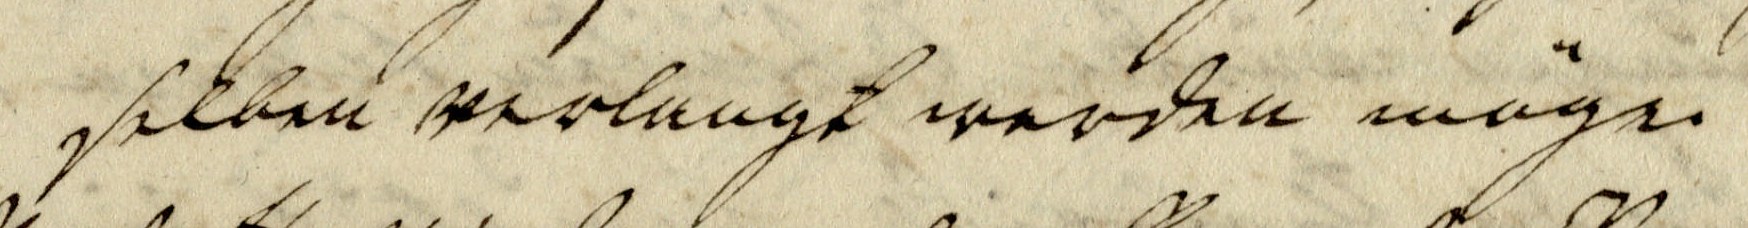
selben verlangt werden möge.
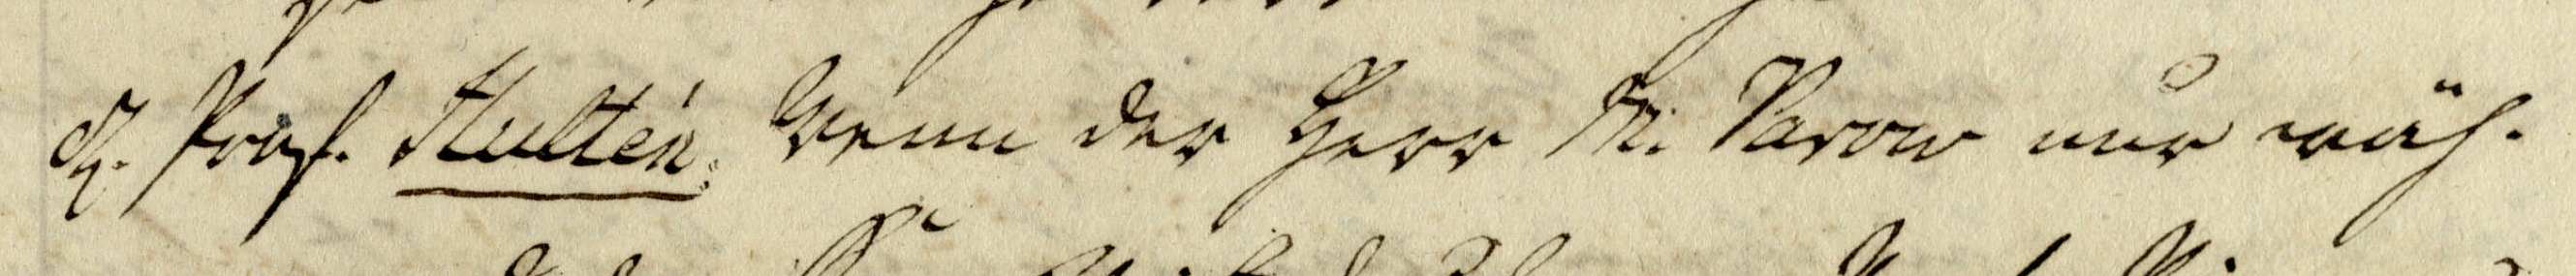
dh. Prof. Hultén. Wenn der Herr M. Parow nur wäh¬
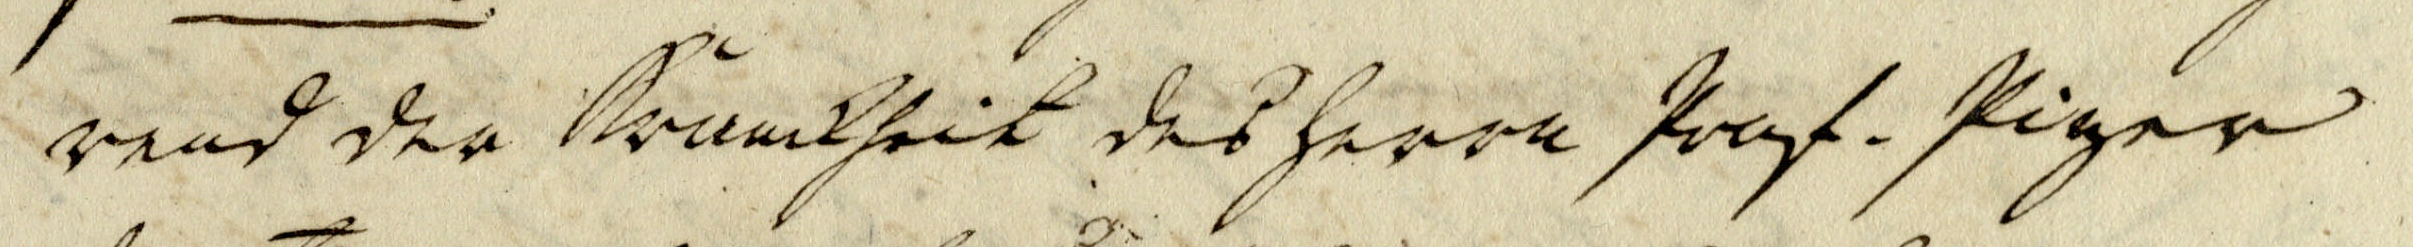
rend der Kranckheit des Herrn Prof. Piper
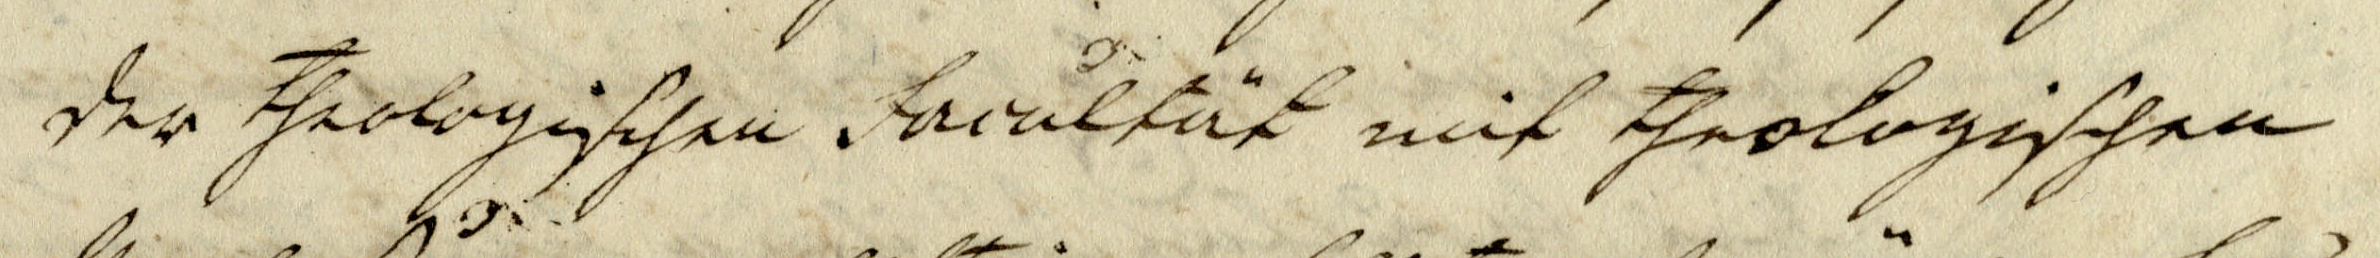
der Theologischen Facultät mit Theologischen
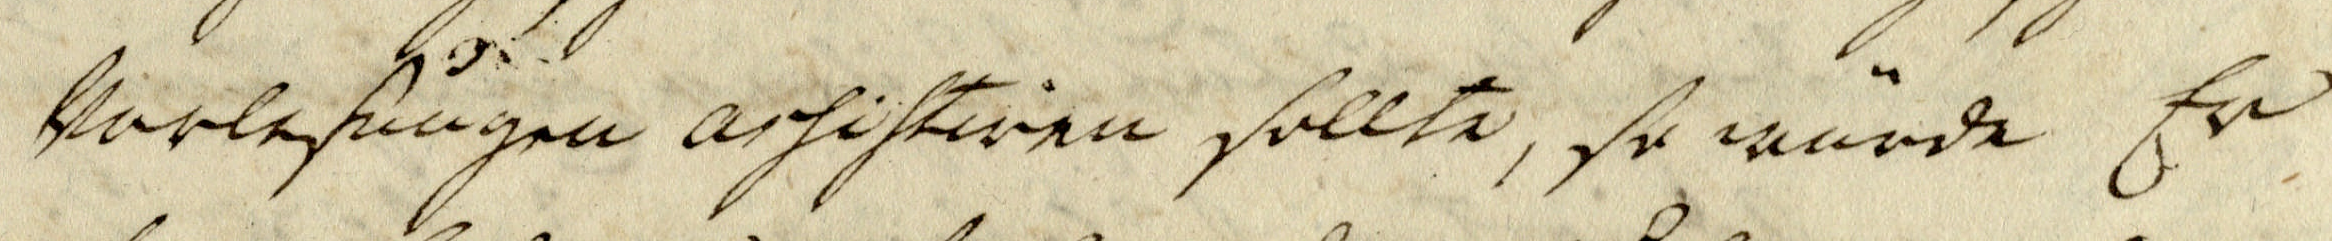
Vorlesungen assistiren sollte, so würde Er
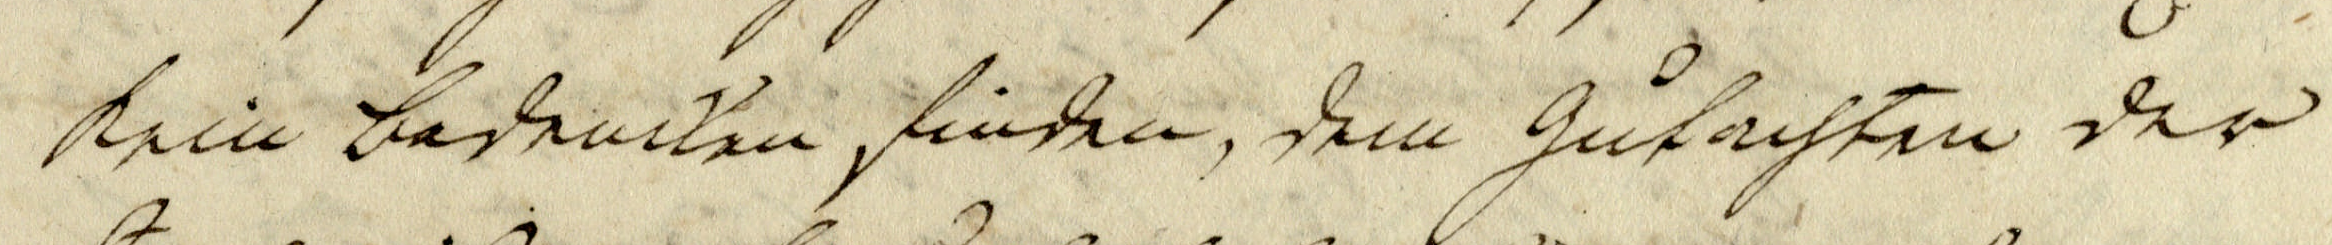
keine Bedencken finden, dem Gutachten der
